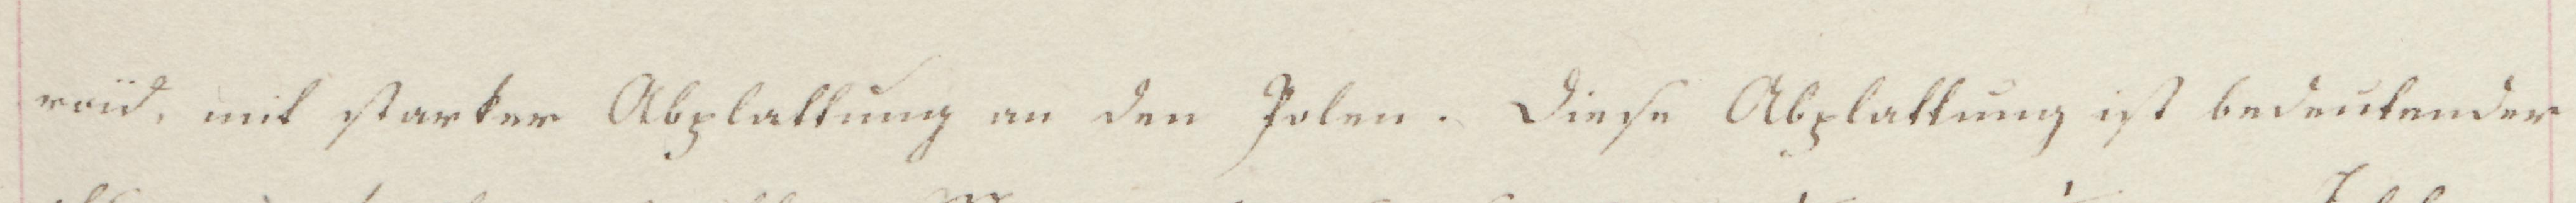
roïd, mit starker Abplattung an den Polen. Diese Abplattung ist bedeutender
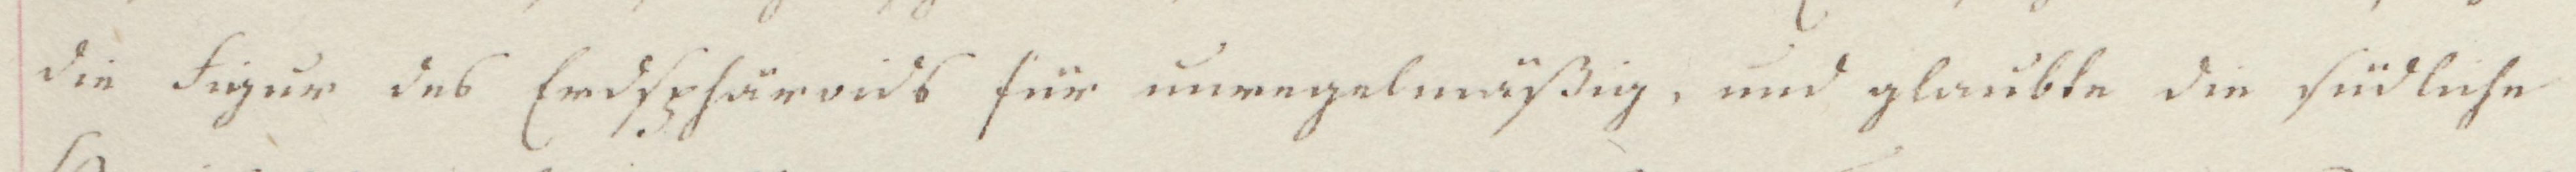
die Figur des Erdsphäroids für unregelmäßig, und glaubte die südliche
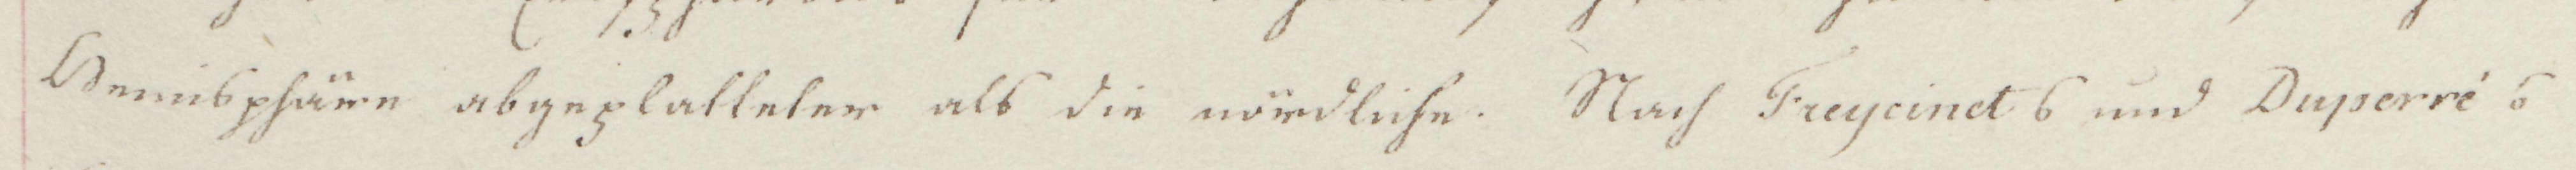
Hemisphäre abgeplatteter als die nördliche. Nach Freycinets und Duperrés
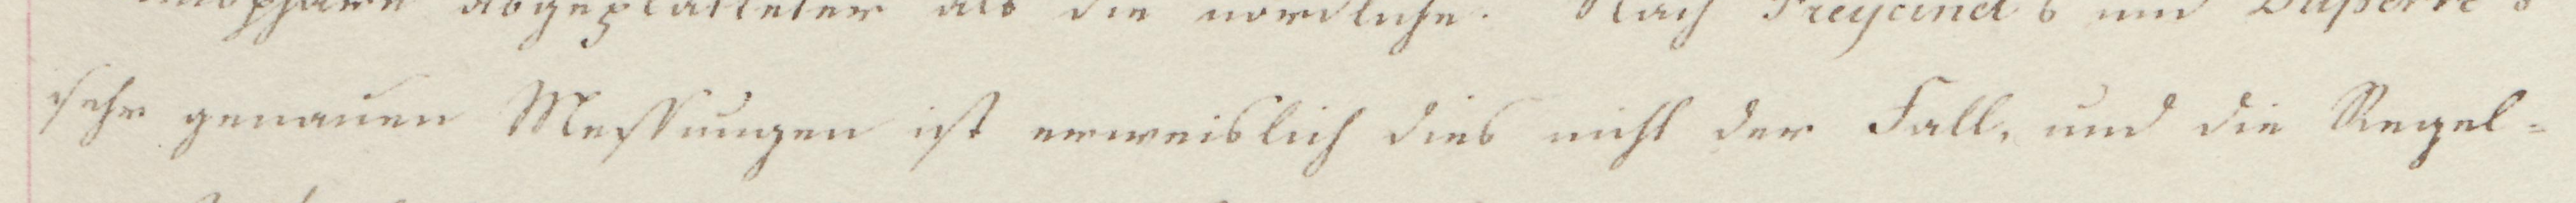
sehr genauen Messungen ist erweislich dies nicht der Fall, und die Regel-
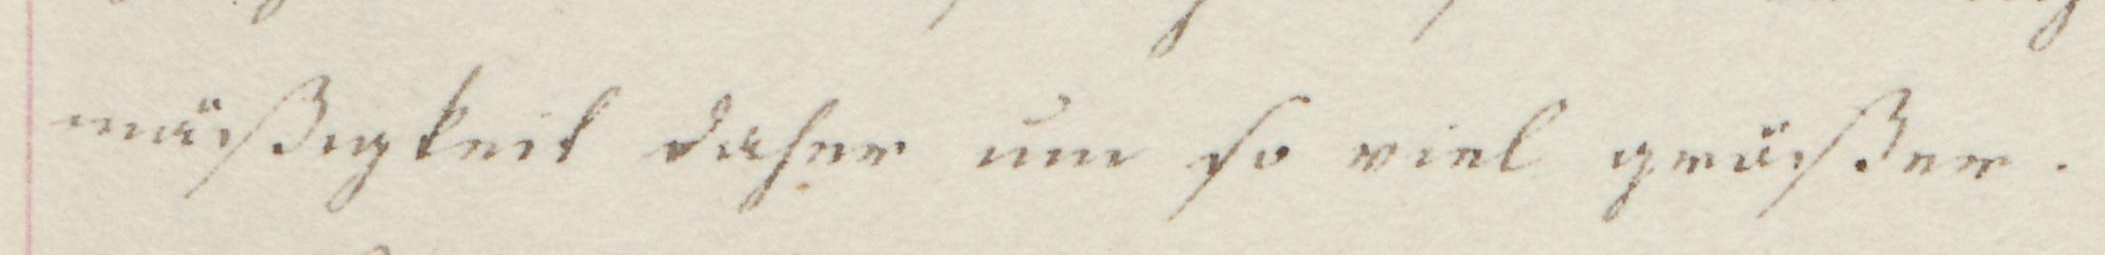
mäßigkeit daher um so viel größer.
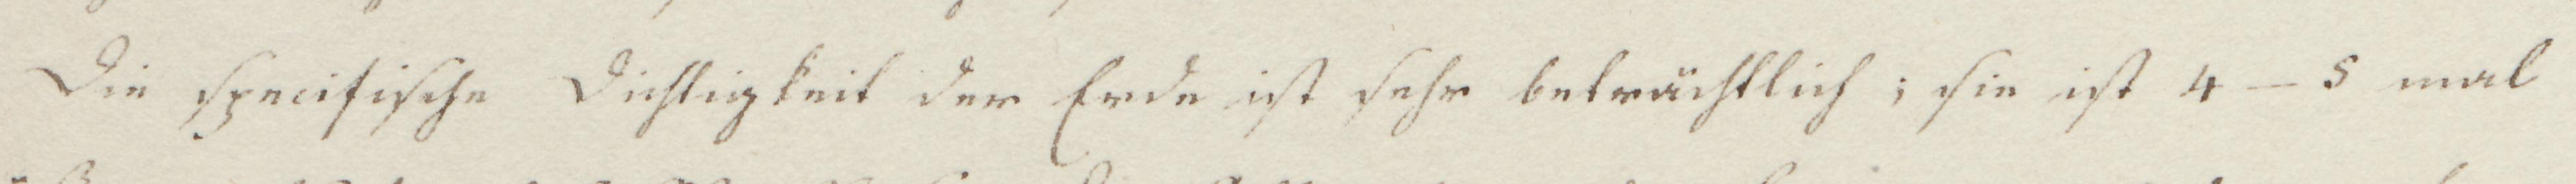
Die specifische Dichtigkeit der Erde ist sehr beträchtlich; sie ist 4–5 mal
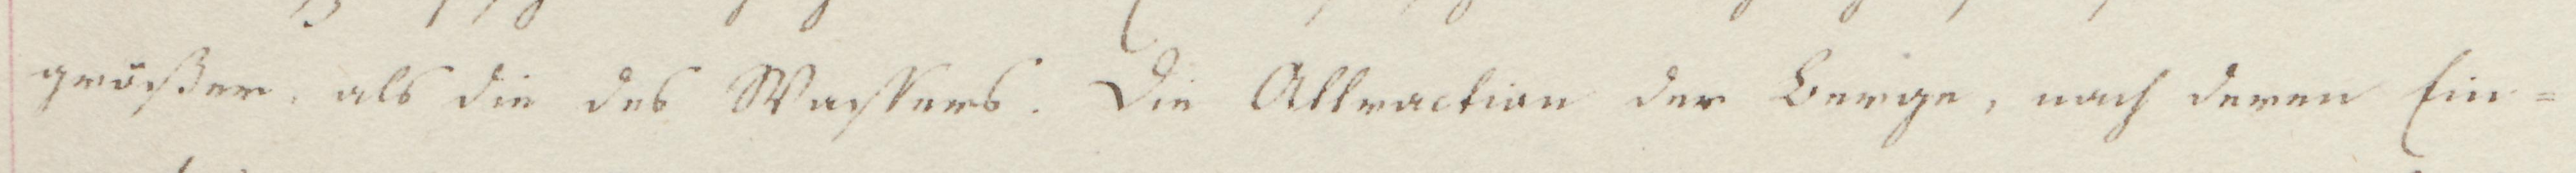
größer, als die des Wassers. Die Attraction der Berge, nach deren Ein-
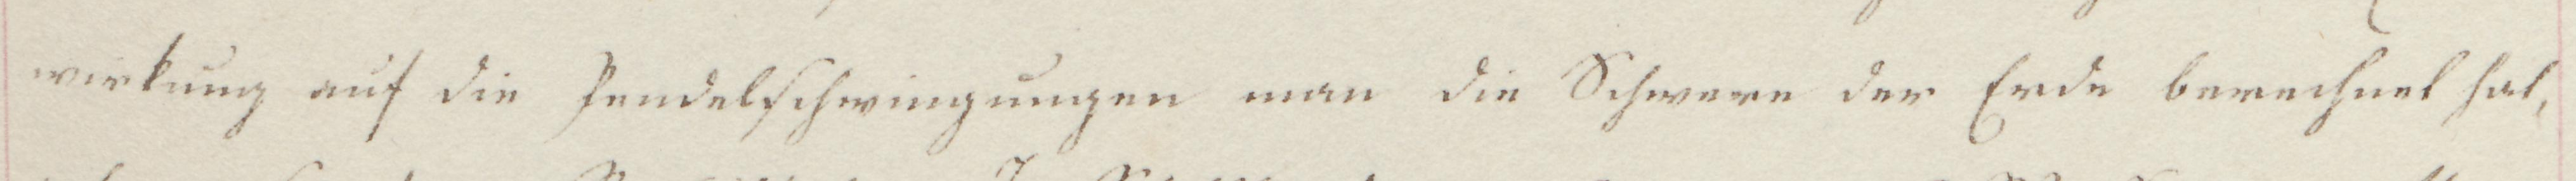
wirkung auf die Pendelschwingungen man die Schwere der Erde berechnet hat,
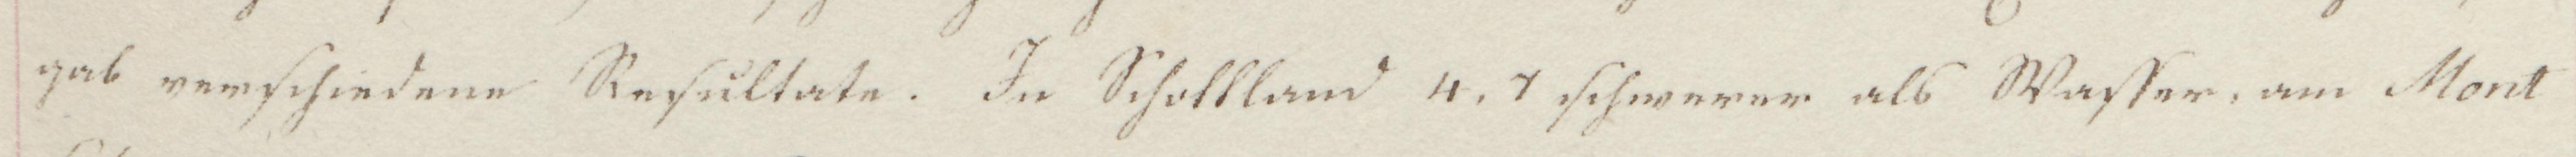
gab verschiedene Resultate. In Schottland 4,7 schwerer als Wasser, am Mont
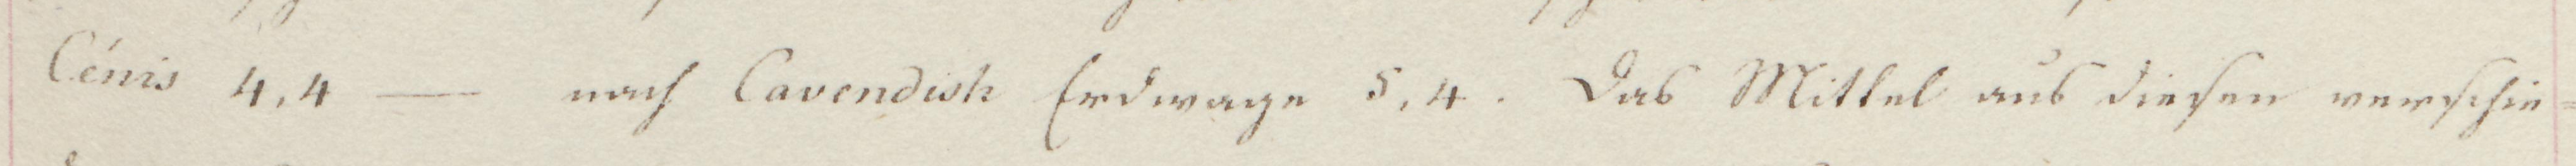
Cénis 4,4 – nach Cavendish Erdwage 5,4. Das Mittel aus diesen verschie-
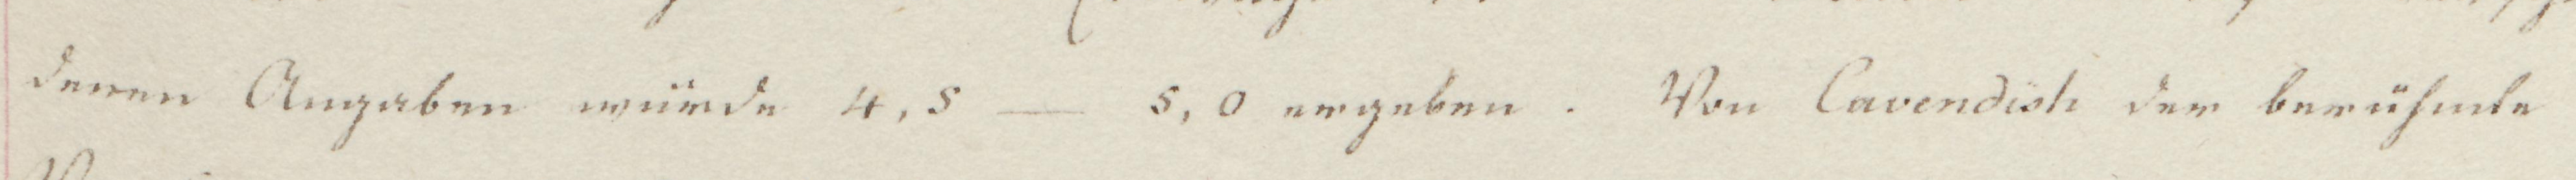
denen Angaben würde 4,5–5,0 ergeben. Von Cavendish der berühmte
